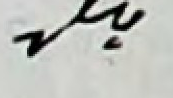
Do
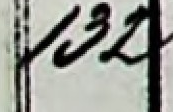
132
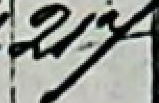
217
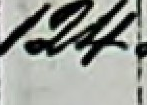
124
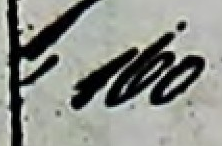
1,160
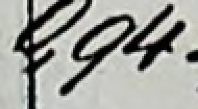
0,94
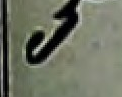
5
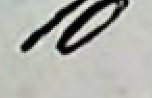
10
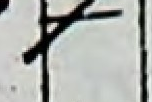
7
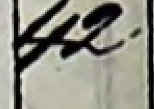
42
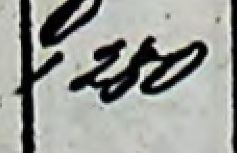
0,280
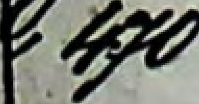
0,470
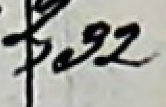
2,32
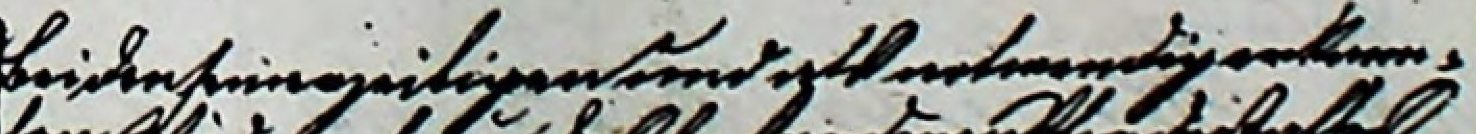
Bei der seiner zeitigen und als notwendiger kann„
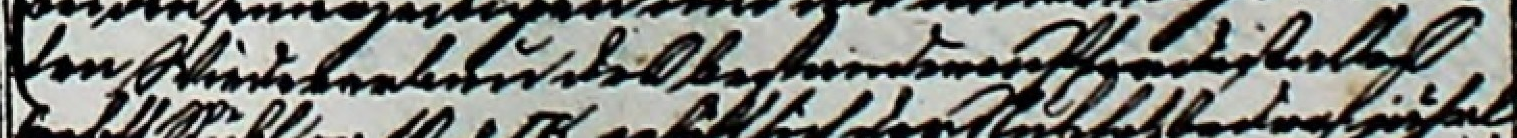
ten Wiedererbau des bestandenen P???
